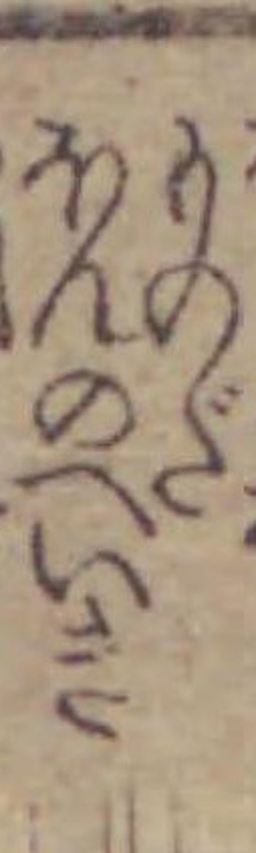ほんのへいき
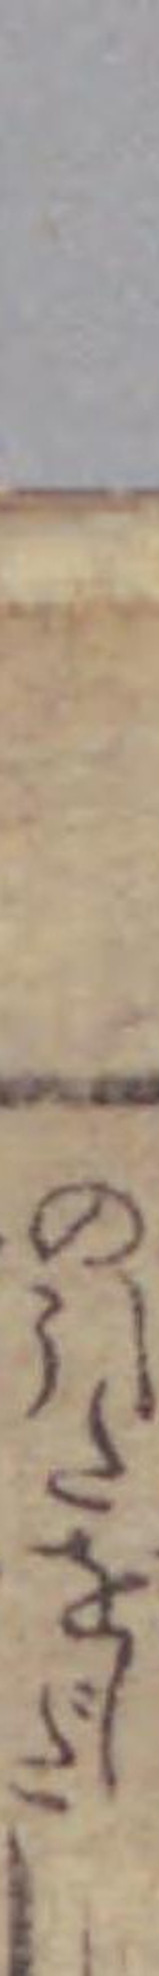の引たをしだ
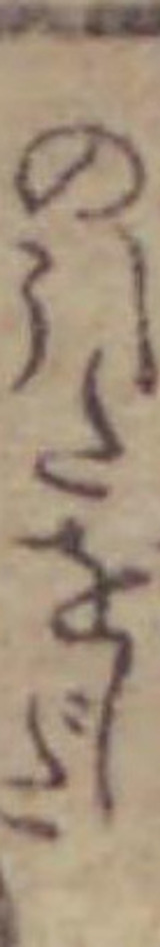の引たをしだ
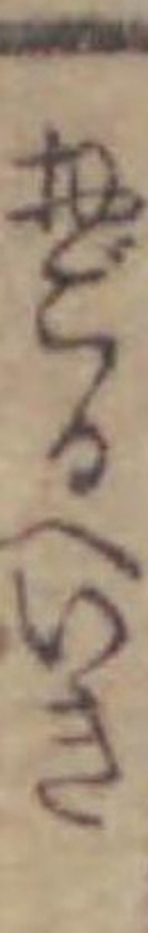おごるへいき
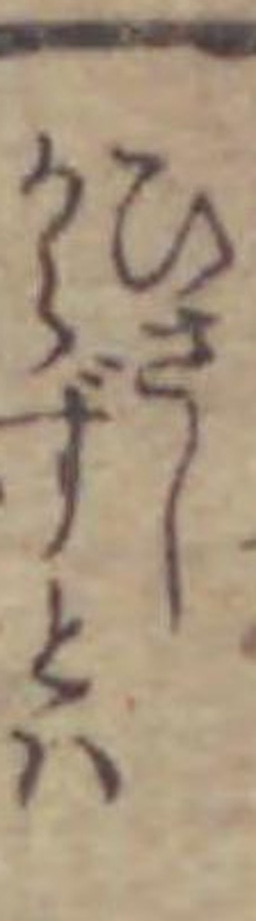からずとは
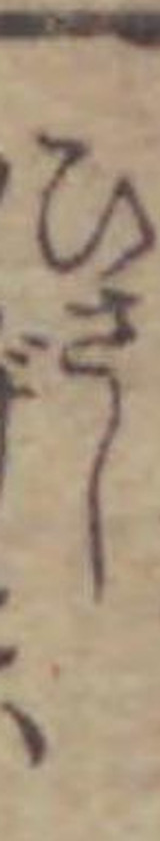ひさし
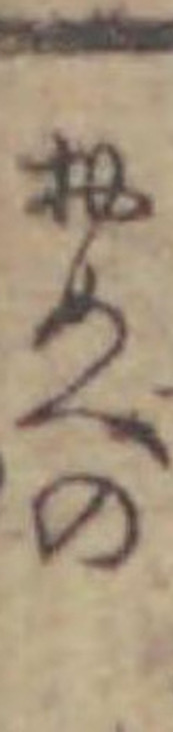おめへの
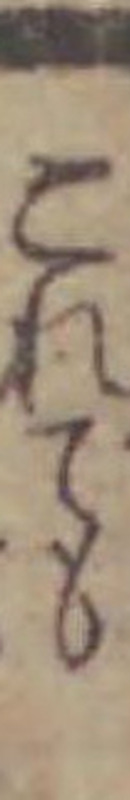これても
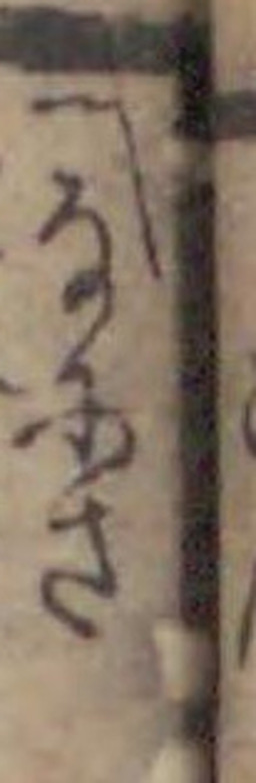「なにさ
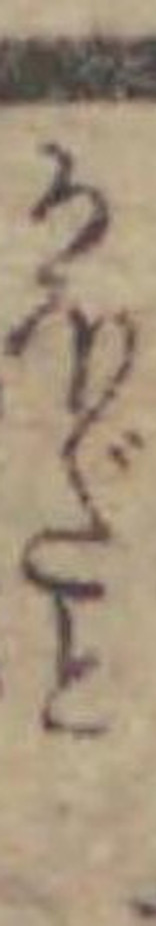かほだと
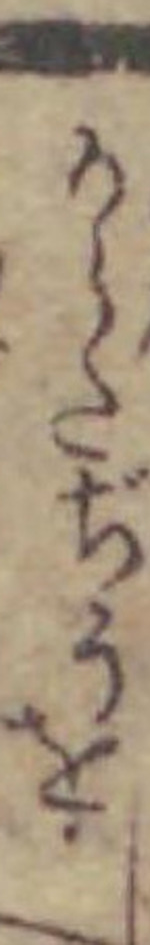からたじうを
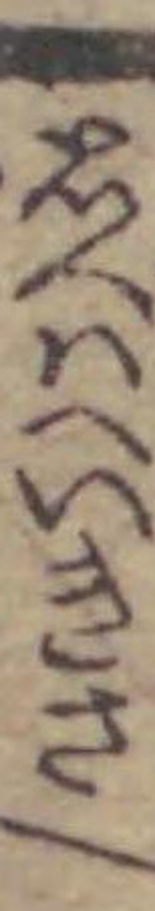思へはへいきさ
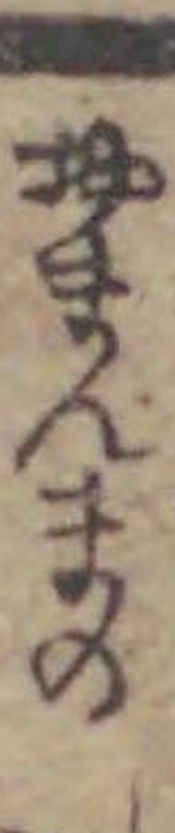おまんまの
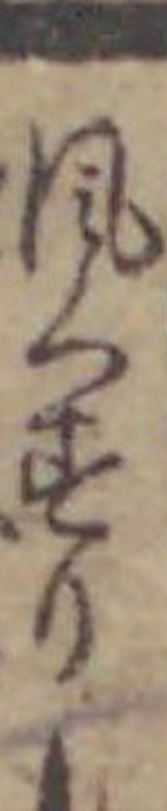風くすり
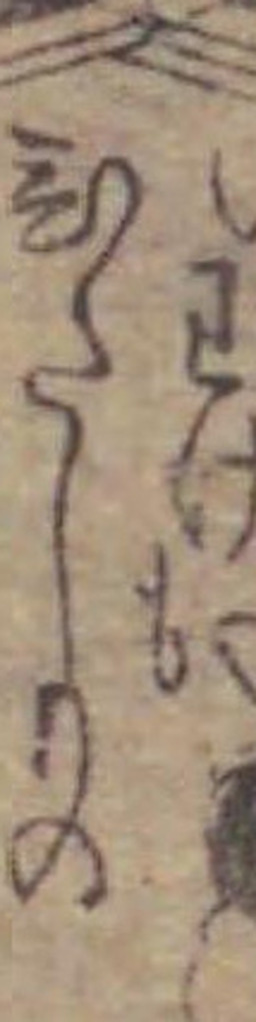ひたしもの
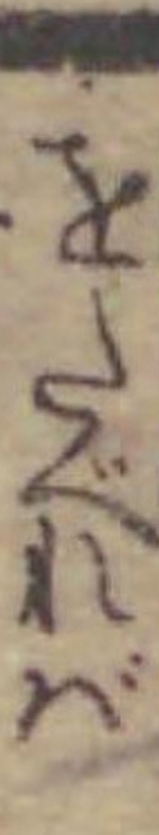をたべれば
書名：九替十年色地獄 : 3巻
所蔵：国立国会図書館 National Diet Library, JAPAN
